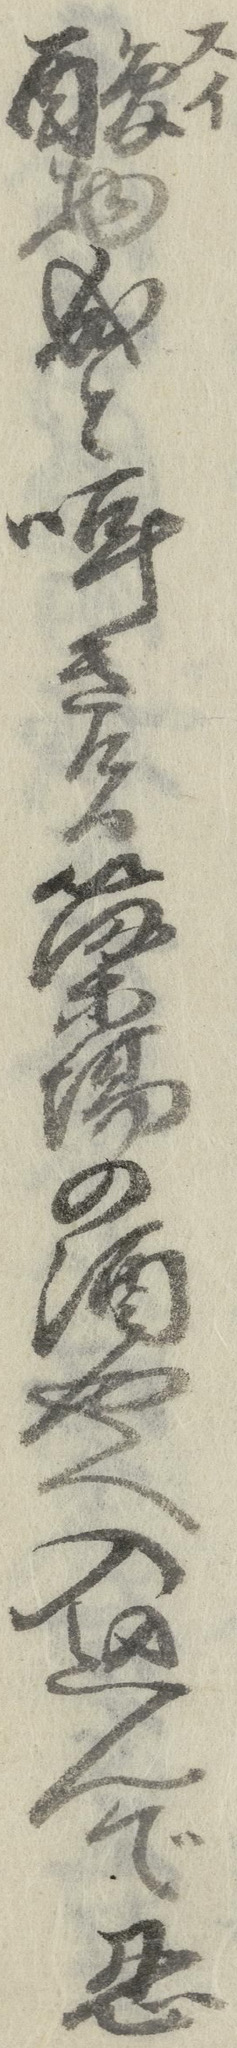酸物成と囁きける簗場の酒やへ入込んで忍

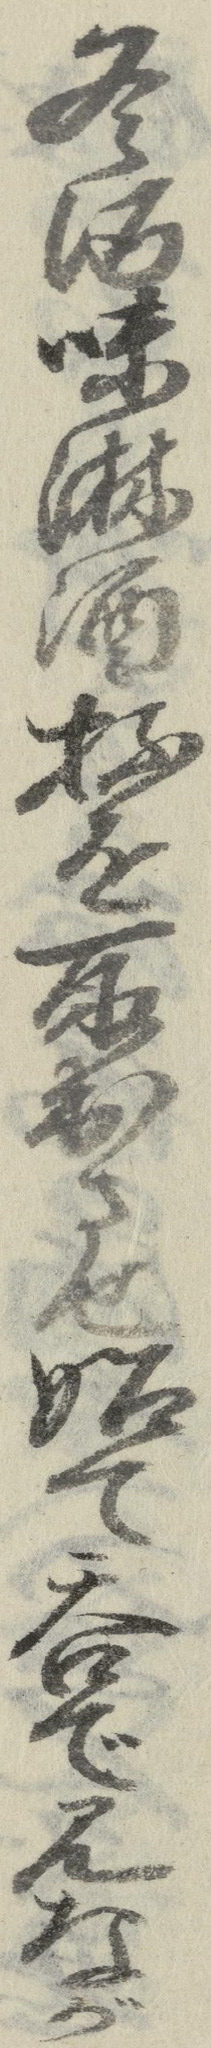冬酒味淋酒抔を取出させ始て呑で見なが
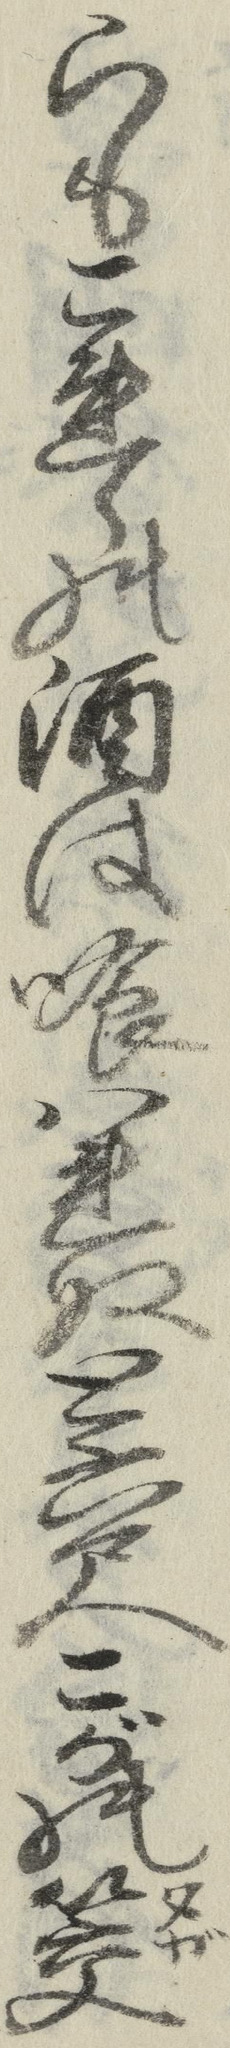らもこれらの酒は喰はれぬと六尺こがの箍
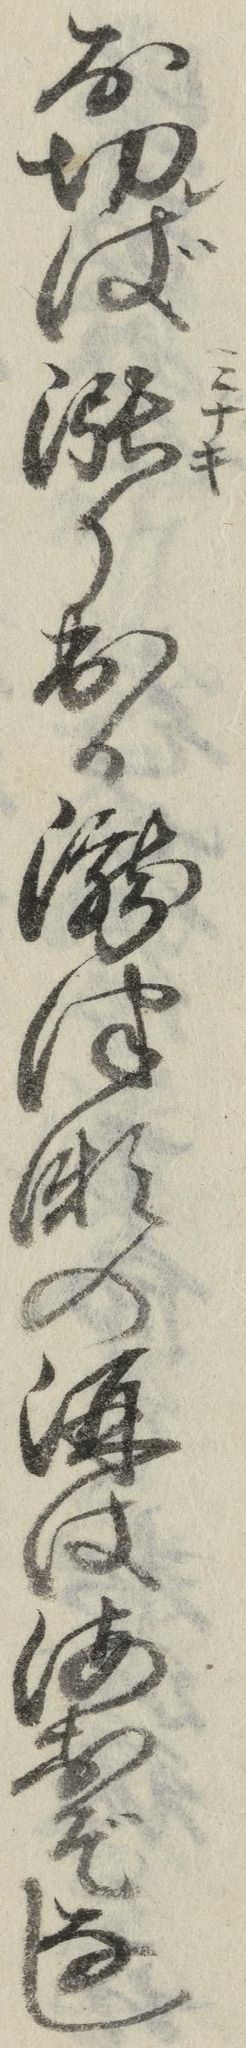お切漲り出る瀧津瀬の酒は海おぞなし
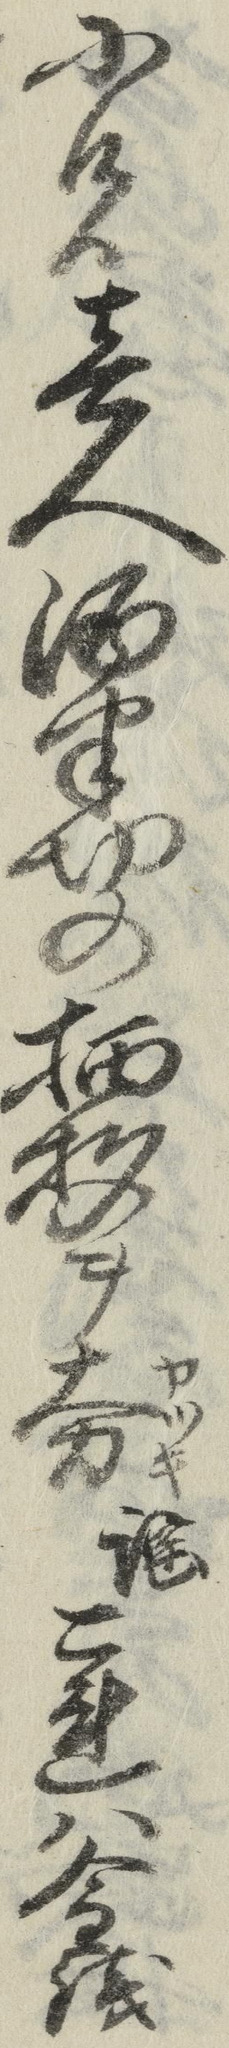にける壱人酒半切の柄杓ヲ夯謳？これは金銭
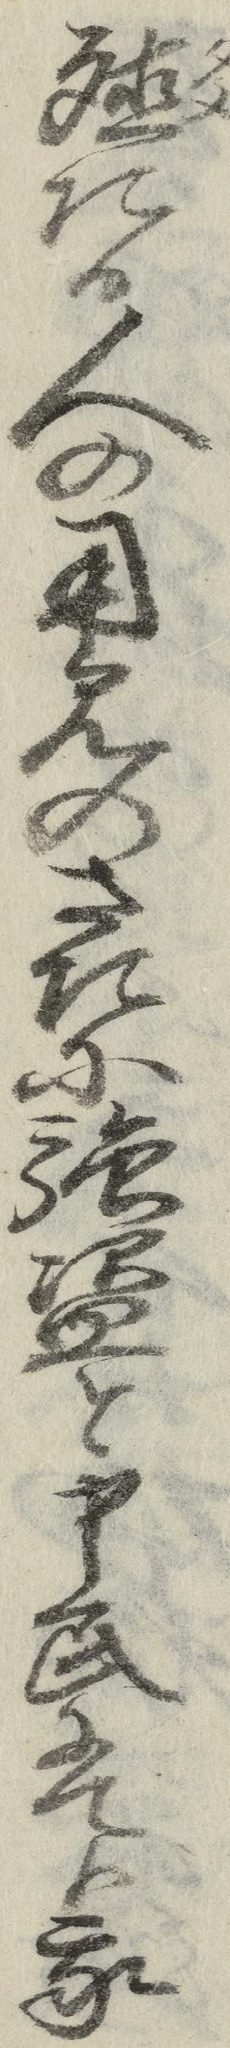殖たる人の用見のさたに強盗と申民にて候我
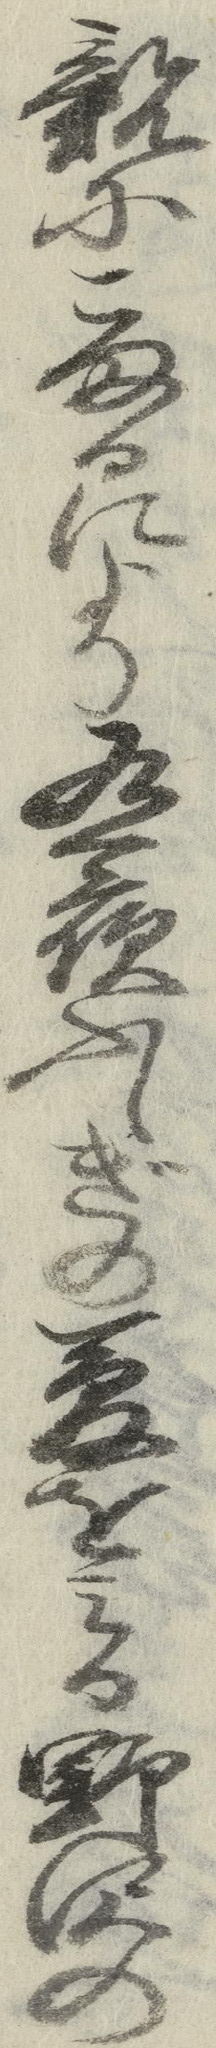親にこまるにより有夜ふしぎの夢をみる野沢の
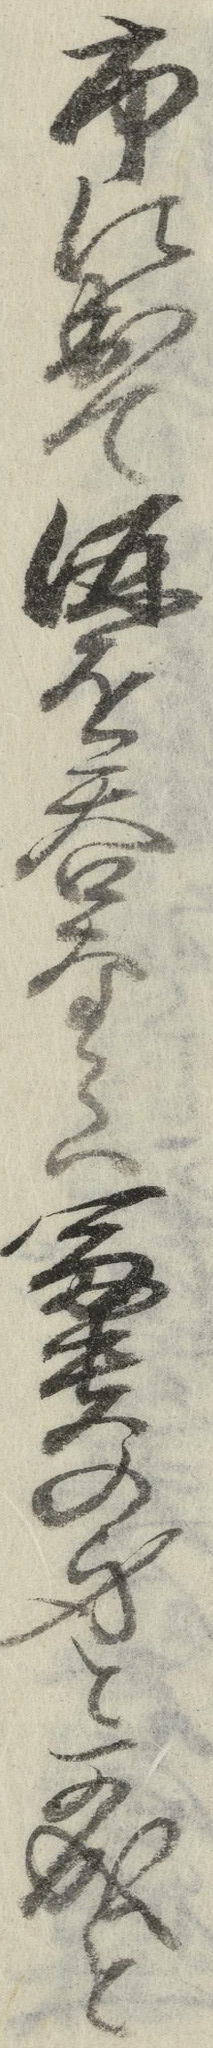市に出て酒を呑ならは富貴の身と可成と
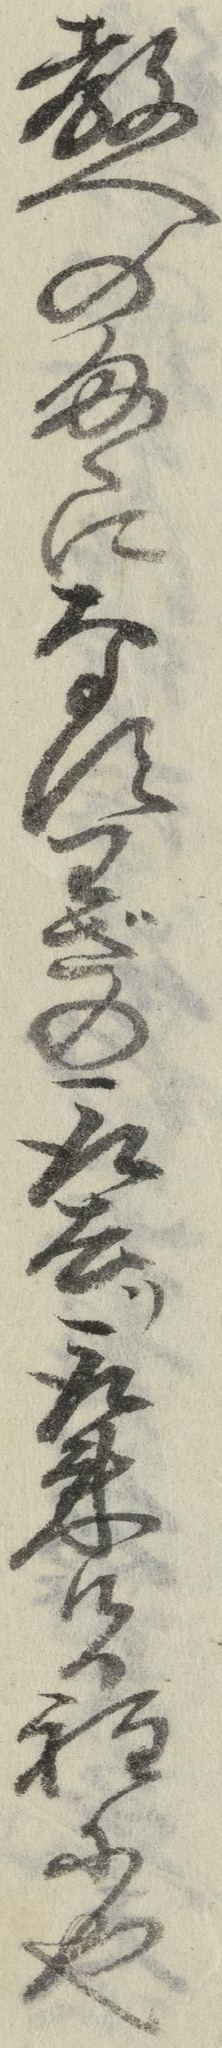教へのまゝになすわざの取去り取来ける程にや
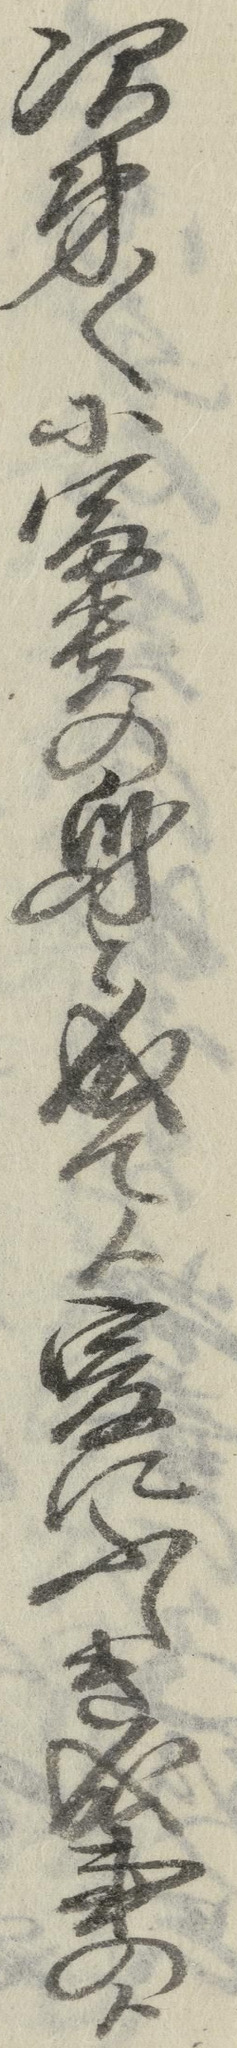次第〳〵に富貴の身と成て候爰にふしき成事の候
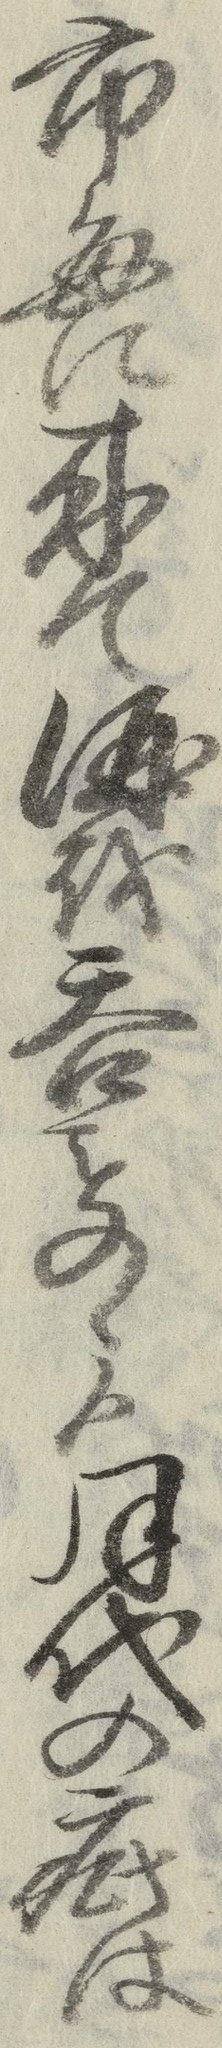市毎に来て酒を呑ものに候月代の疵は
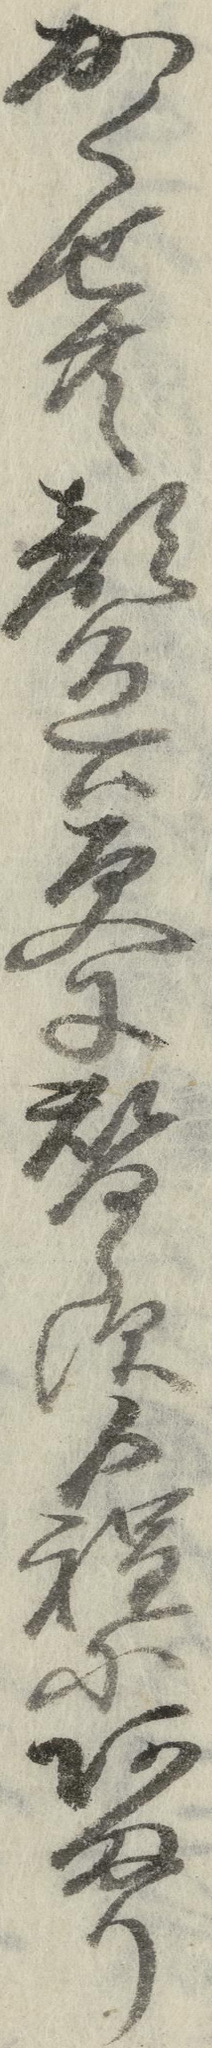かくせ共顔色は更に替らす候程にあたり
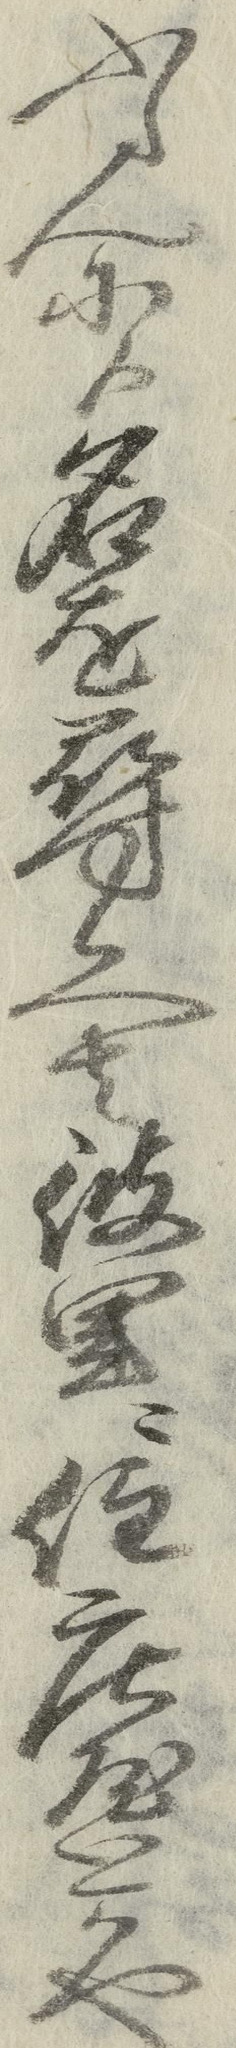ふるへに候名を尋らへ共彼里に住庄屋とかや
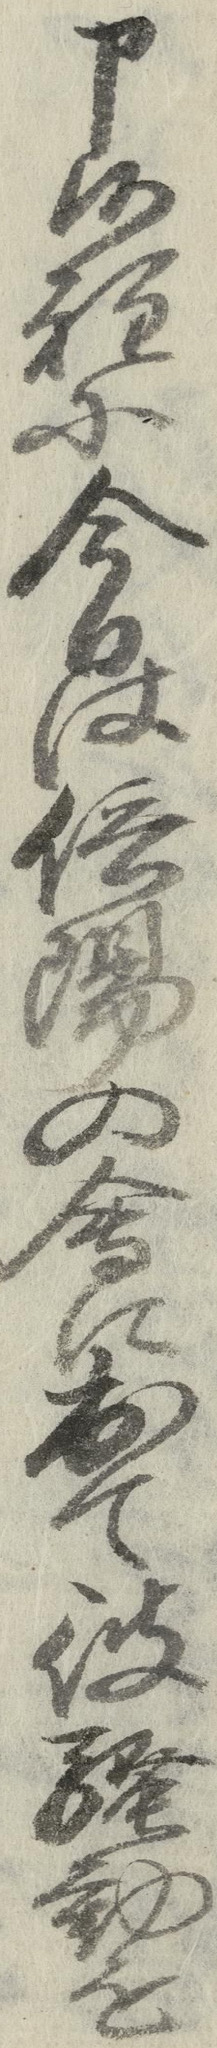申候程に今日は信陽の会に出て彼騒動を
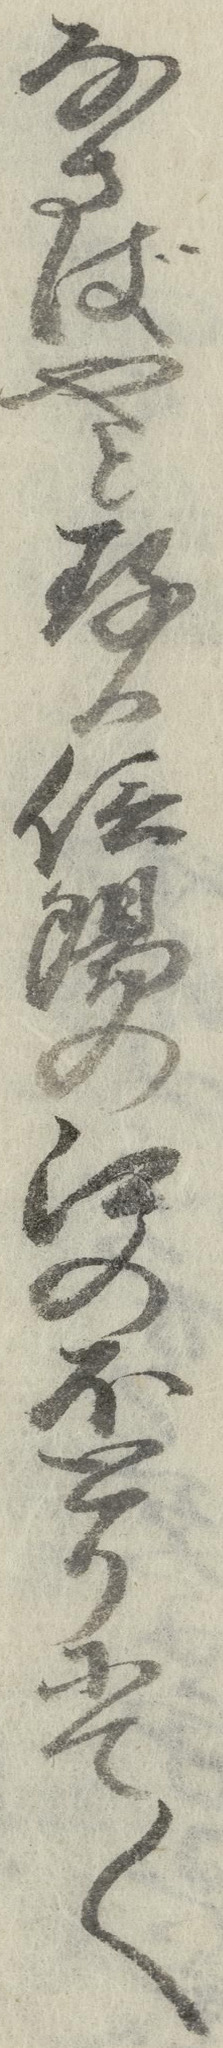なさばやと存候信陽の江のほとりにて〳〵
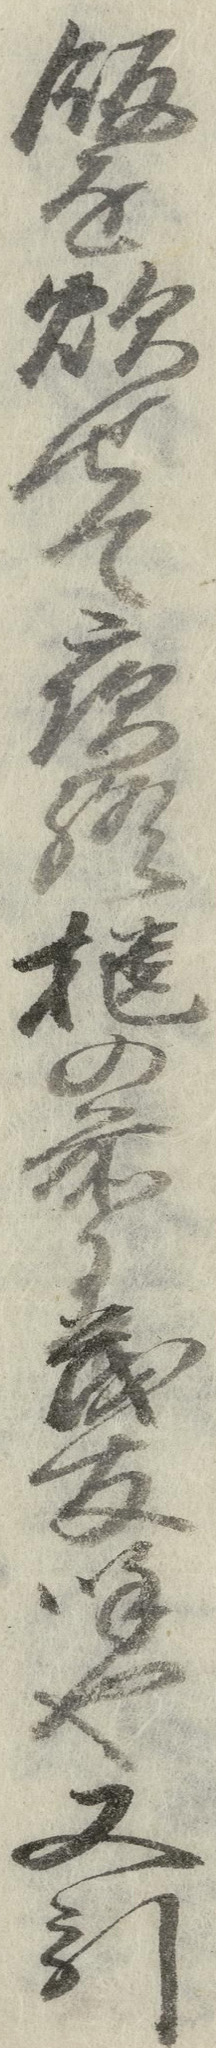飯を炊せて夜終櫃の前にも友呼や又引
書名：浅間大焼騒動記　中
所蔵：東京大学地震研究所図書室 Earthquake Research Institute Library, The University of Tokyo, JAPAN
